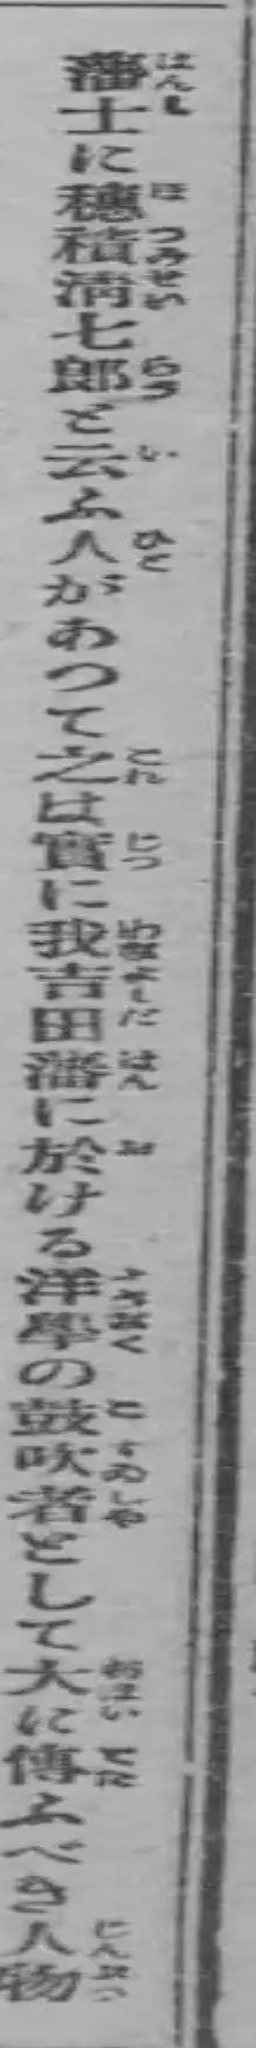藩士に穂積清七郎と云ふ人があつて之は実に我吉田藩に於ける洋学の鼓吹者として大に伝ふべき人物
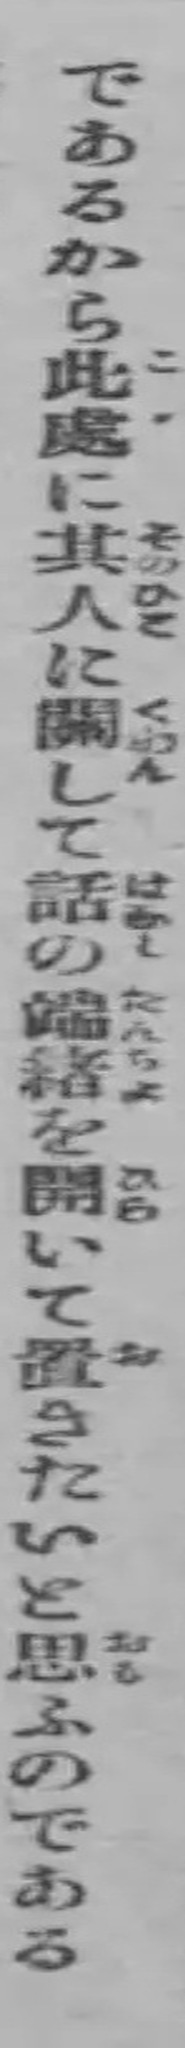であるから此処に其人に関して話の端緒を開いて置きたいと思ふのである
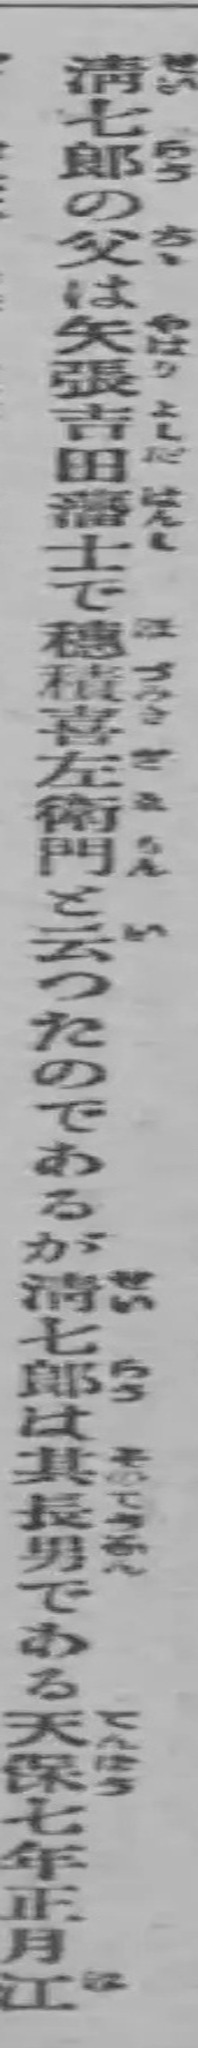清七郎の父は矢張吉田藩士で穂積喜左衛門と云つたのであるが清七郎は其長男である天保七年正月江
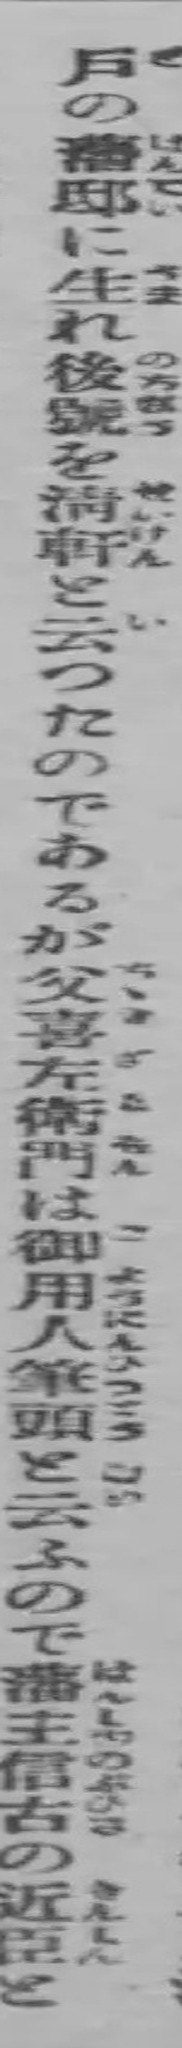戸の藩邸に生れ後号を清軒と云つたのであるが父喜左衛門は御用人筆頭と云ふので藩主信古の近臣と
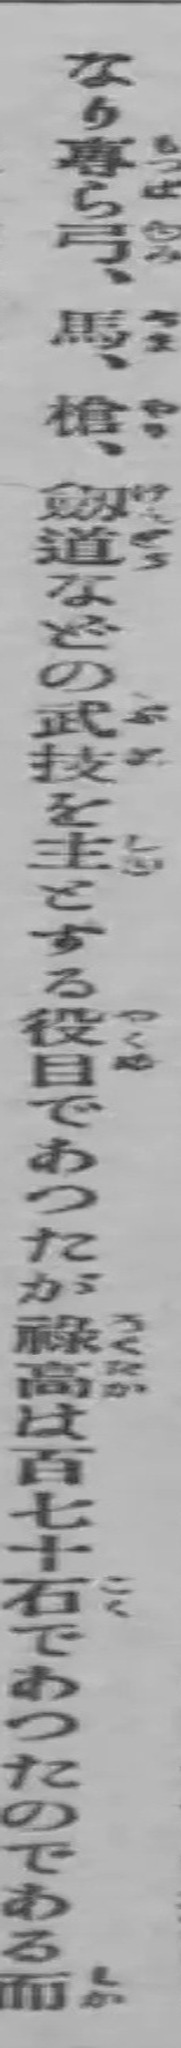なり専ら弓、馬、槍、劔道などの武技を主とする役目であつたが禄高は百七十石であつたのである而
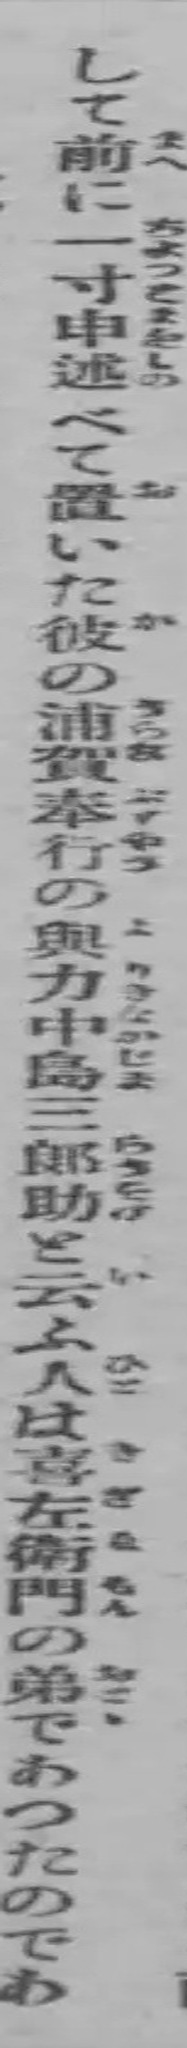して前に一寸申述べて置いた彼の浦賀奉行の与力中島三郎助と云ふ人は喜左衛門の弟であつたのであ
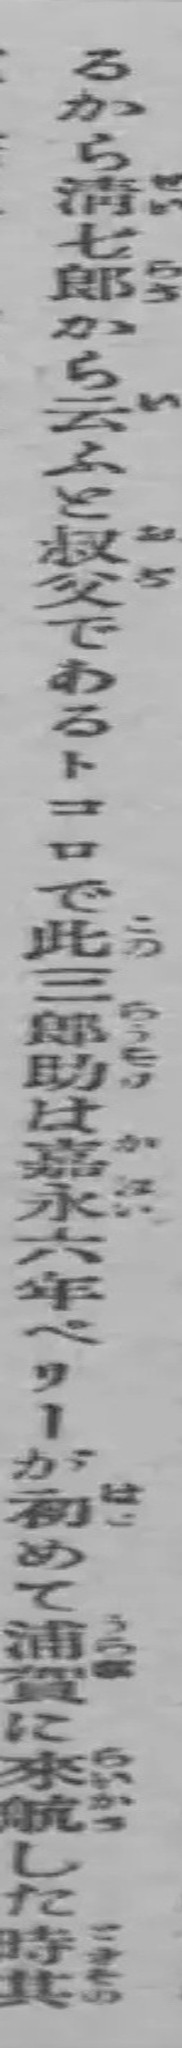るから清七郎から云ふと叔父であるトコロで此三郎助は嘉永六年ペリーが初めて浦賀に来航した時其
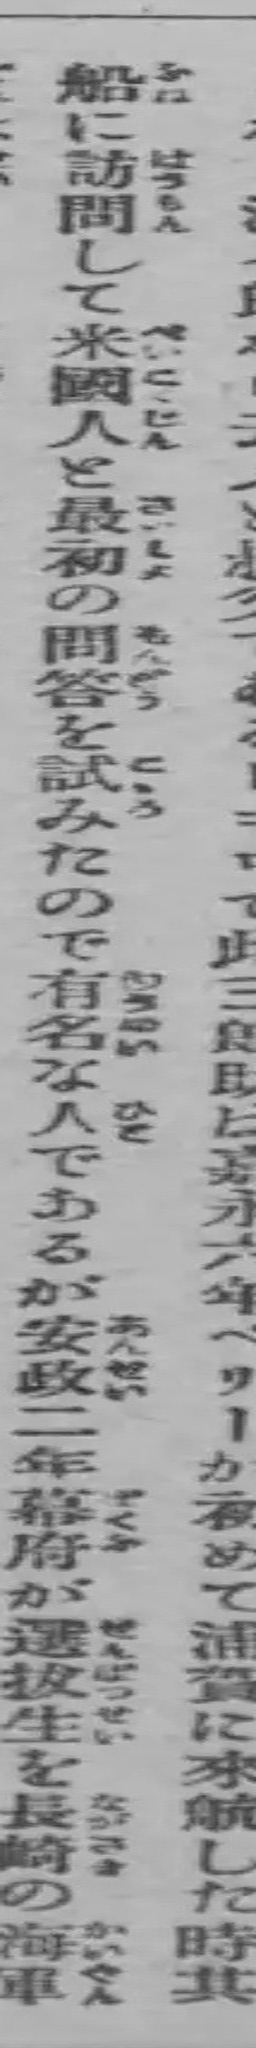船に訪問して米国人と最初の問答を試みたので有名な人であるが安政二年幕府が選抜生を長崎の海軍
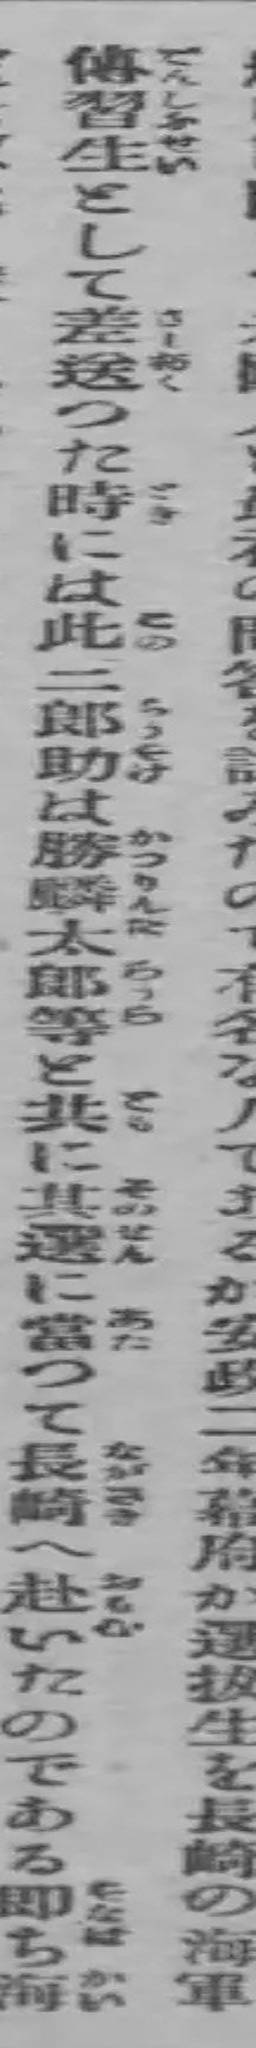伝習生として差送つた時には此三郎助は勝麟太郎等と共に其選に当つて長崎へ赴いたのである即ち海
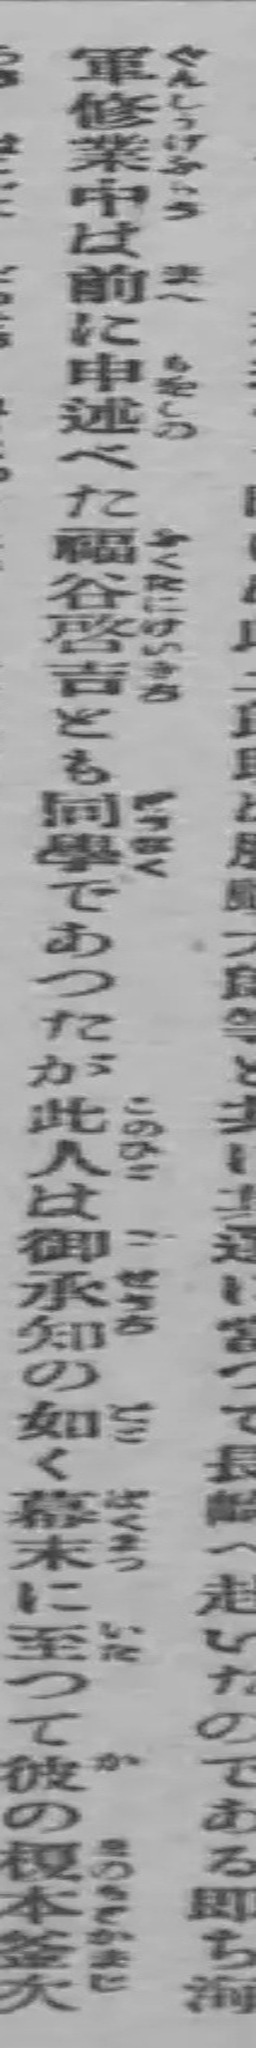軍修行中は前に申述べた福谷啓吉とも同学であつたが此人は御承知の如く幕末に至つて彼の榎本釜次
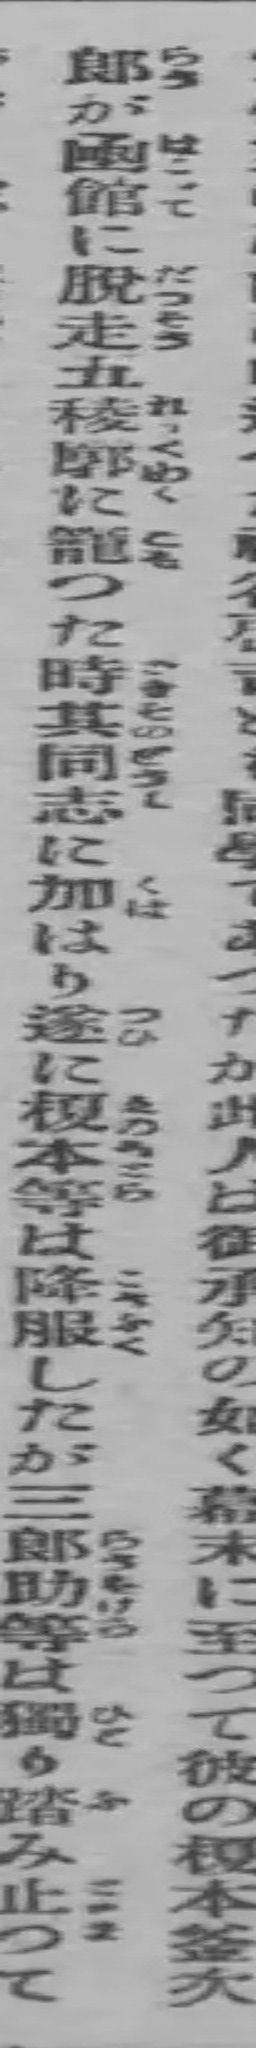郎が函館に脱走五稜郭に籠つた時其同志に加はり遂に榎本等は降服したが三郎助は独り踏み止つて
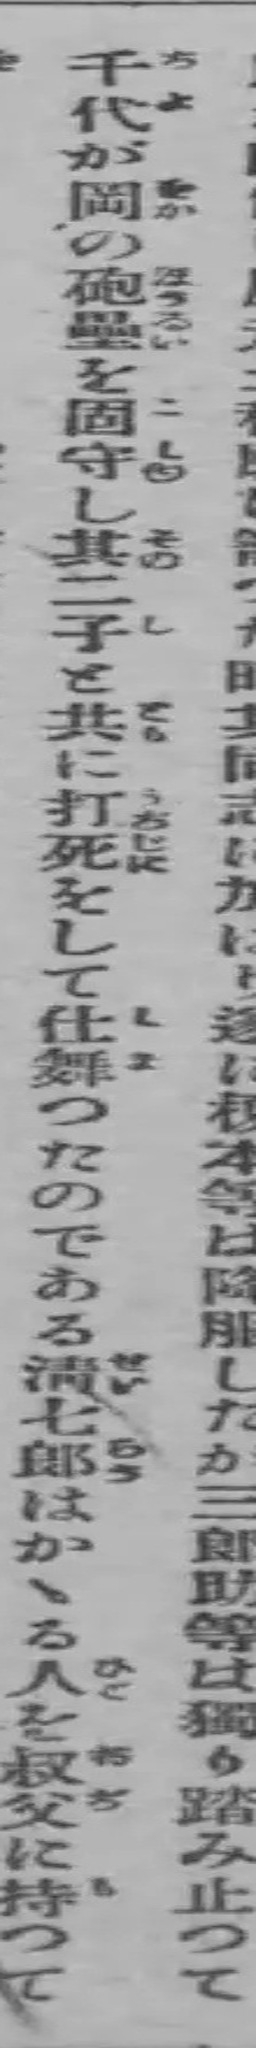千代が岡の砲塁を固守し其二子と共に打死をして仕舞つたのである清七郎はかゝる人を叔父に持つて
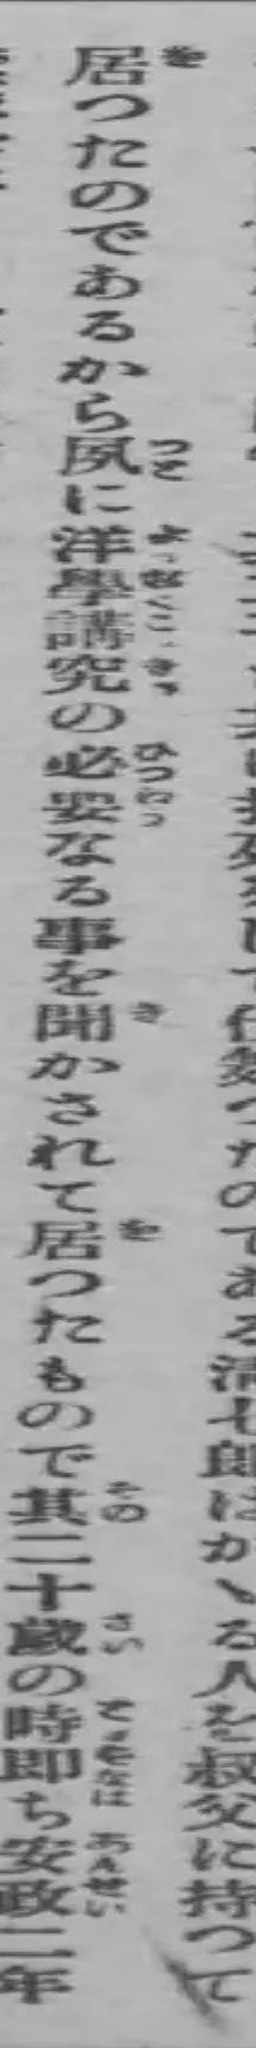居つたのであるから夙に洋学講究の必要なる事を聞かされて居つたもので其二十歳の時即ち安政二年
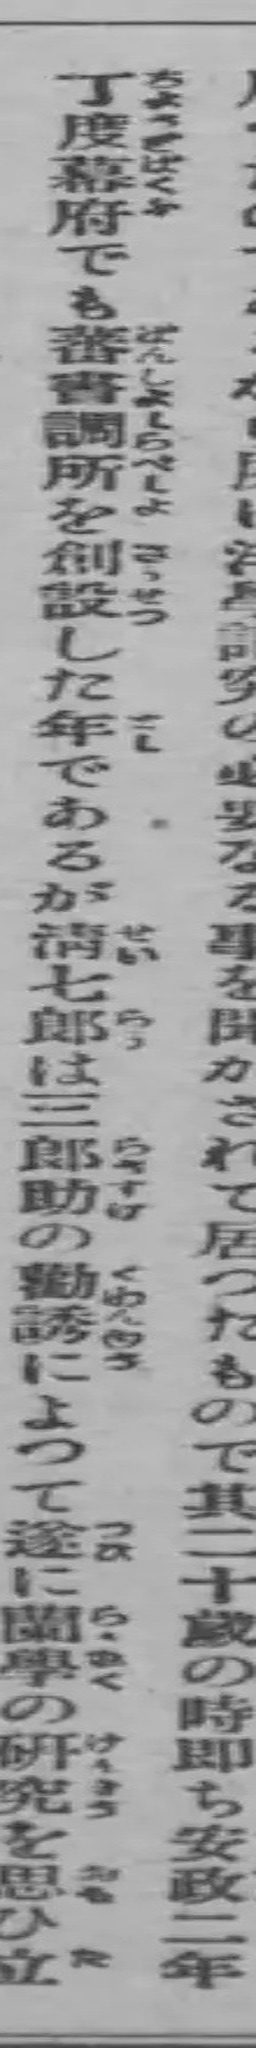丁度幕府でも蕃書調所を創設した年であるが清七郎は三郎助の勧誘によつて遂に蘭学の研究を思ひ立
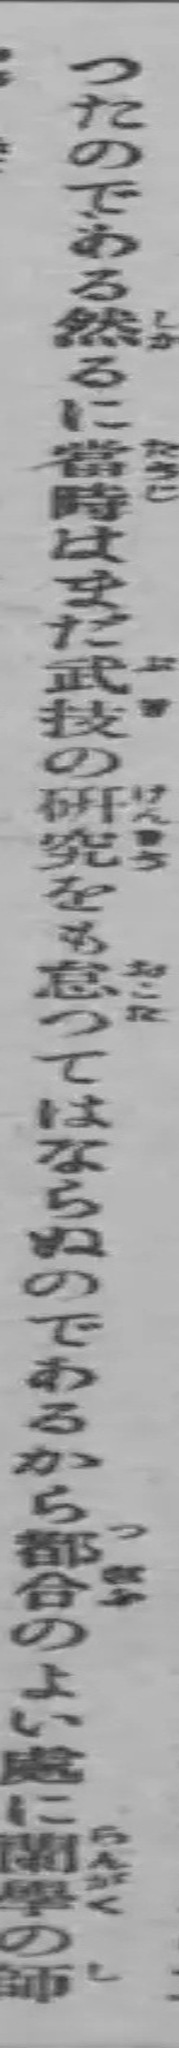つたのである然るに当時はまだ武技の研究をも怠つてはならぬのであるから都合のよい処に蘭学の師
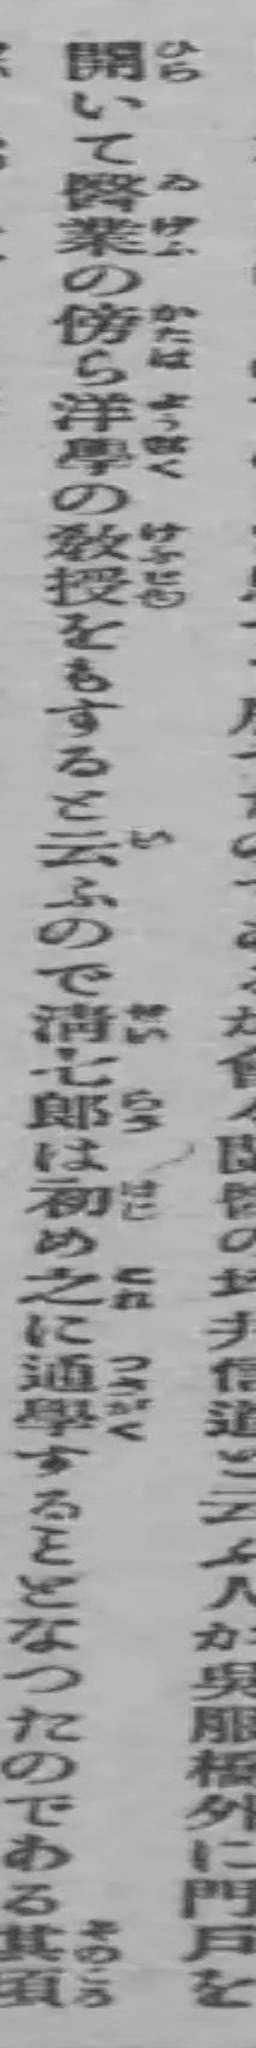開いて医業の傍ら洋学の教授をもすると云ふので清七郎は初め之に通学することとなつたのである其頃
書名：豊橋市史談
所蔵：国立国会図書館 National Diet Library, JAPAN
